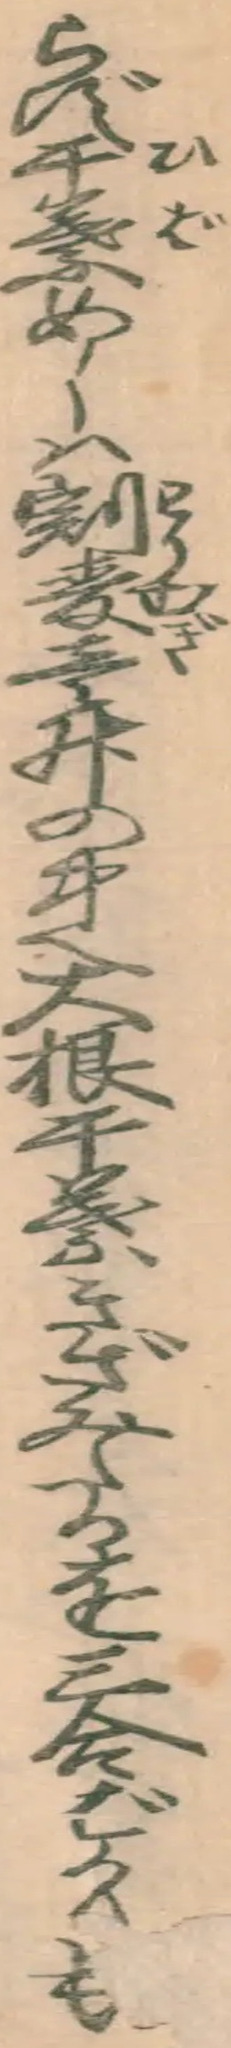らず干葉めしは割麦壱升の中へ大根干葉きざみたるを三合ばかりも
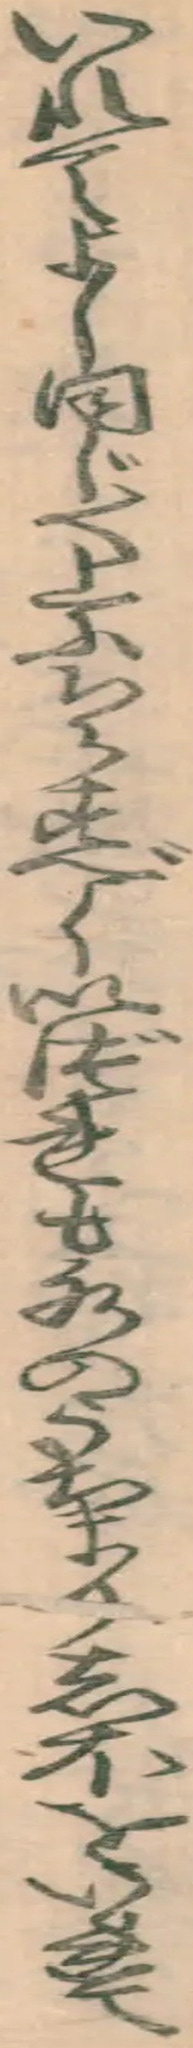いれてよし同じく上にちらすべしいづれも水のうちよりしほをいれて
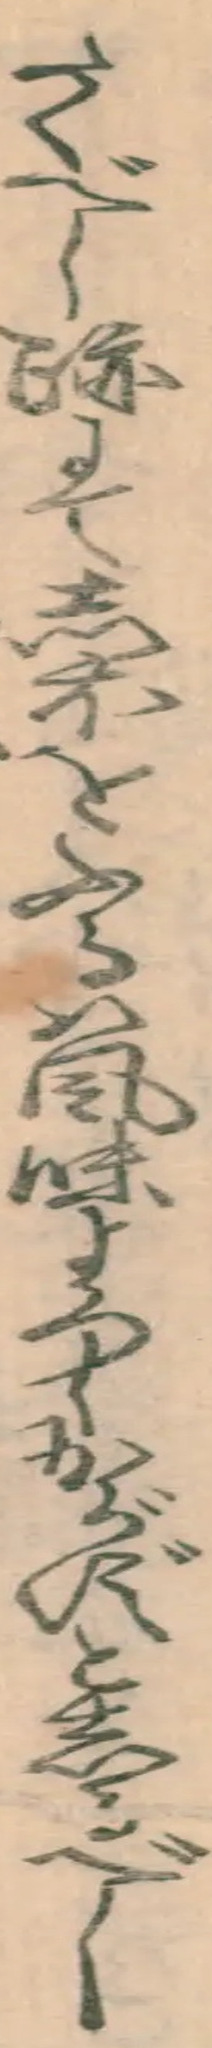たくべし跡にてしほをふるは風味よろしかがずとしるべし
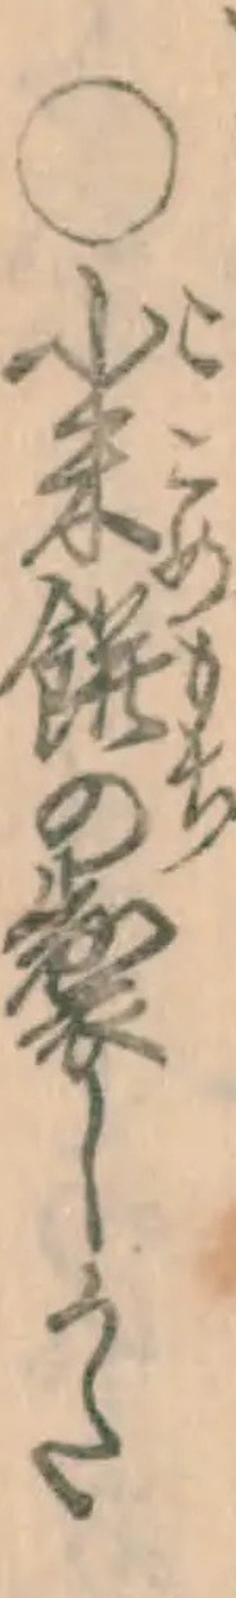○小米餅の製しかた
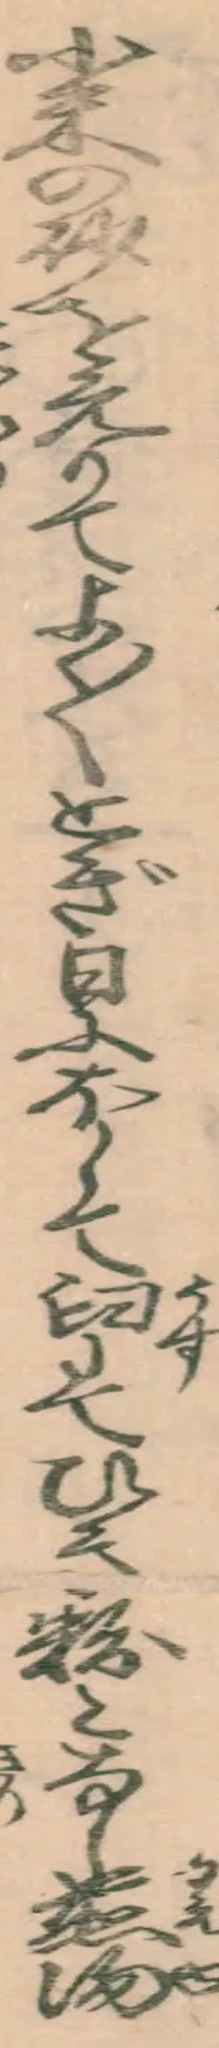小米の砂をえりてよく〳〵とぎ日にほして臼にてひき粉となし煎湯
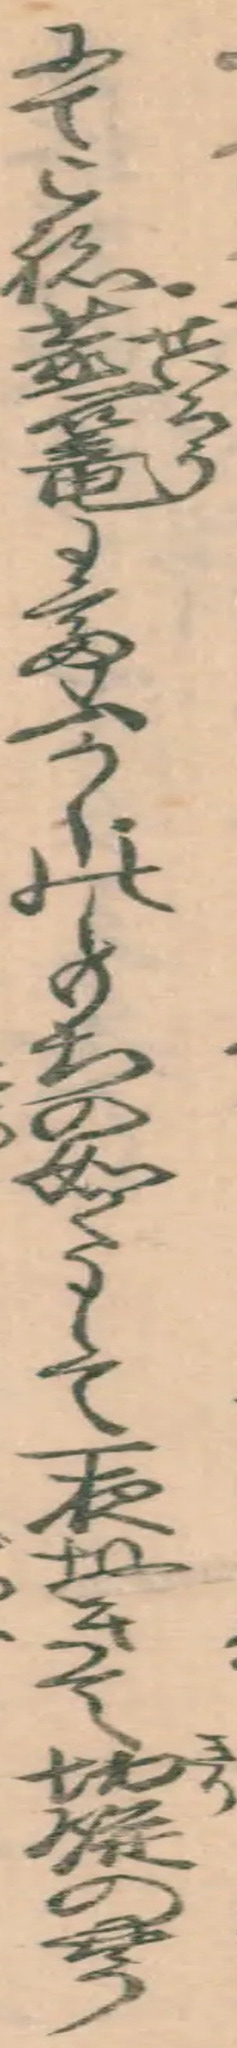にてこね．蒸篭にてふかし．のしもちの如くにして一夜おきて切餅のやう
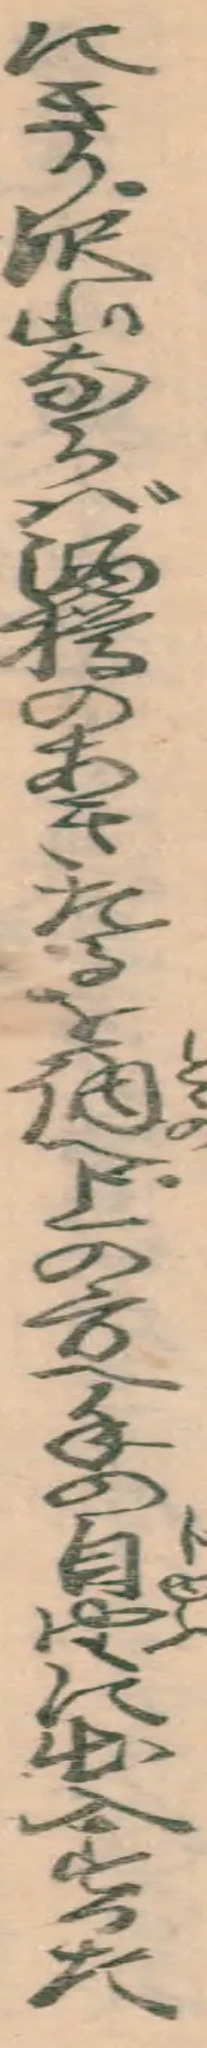にきり．沢山ならば酒樽のあきたるを調へ．上の方へ手の自由に出入するた
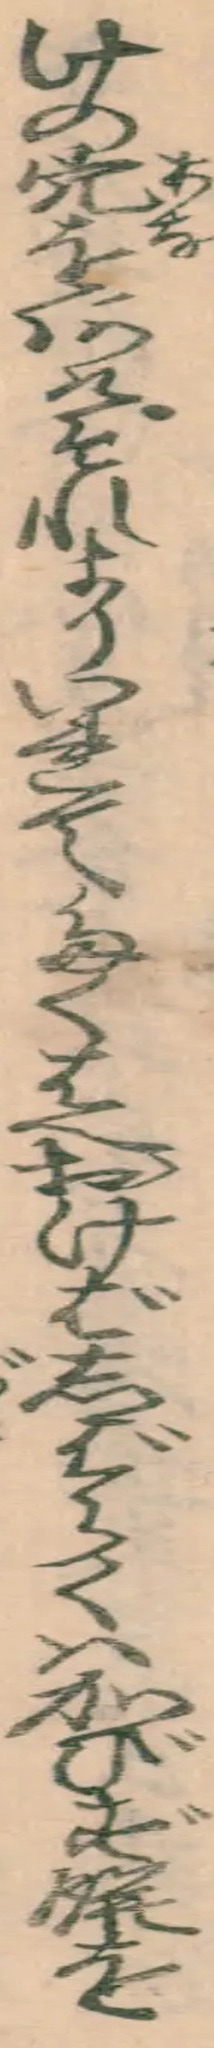けの穴をあけ．それよりいれてたくはへおけばしばらくはかびず餅を
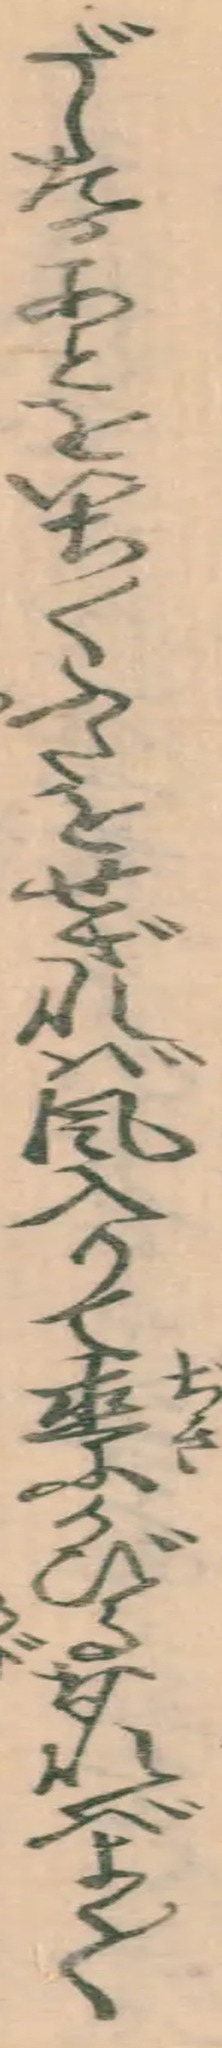だしたるあとをいち〳〵ふたをせざれば風入りて直にかびるなればよく〳〵
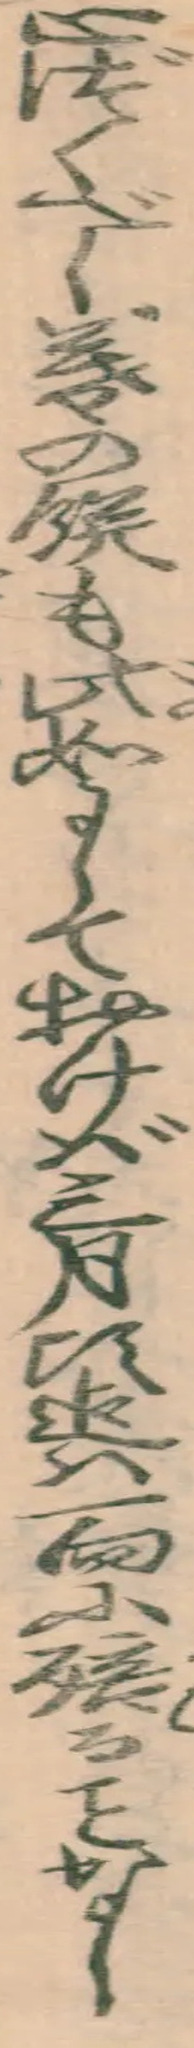心づくべし．暮の餅も此如にしておけば三月頃迄は一向に殕ることなし
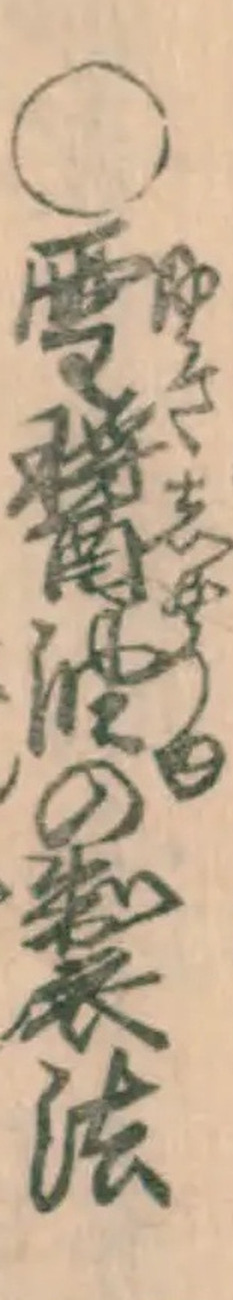○雪醤油の製法
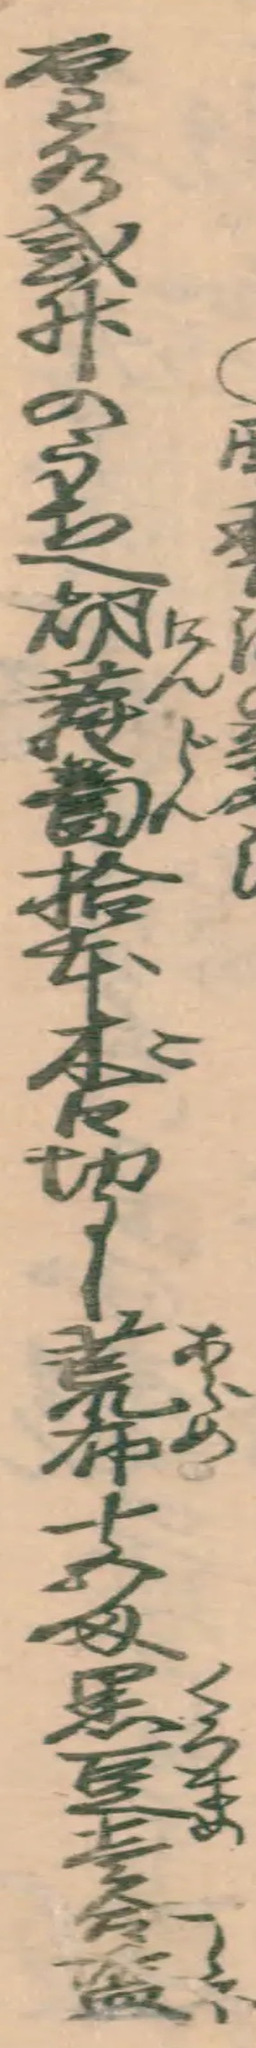雪水弐升のうちへ胡蘿蔔拾本木口切にし荒布十五匁黒豆壱合塩
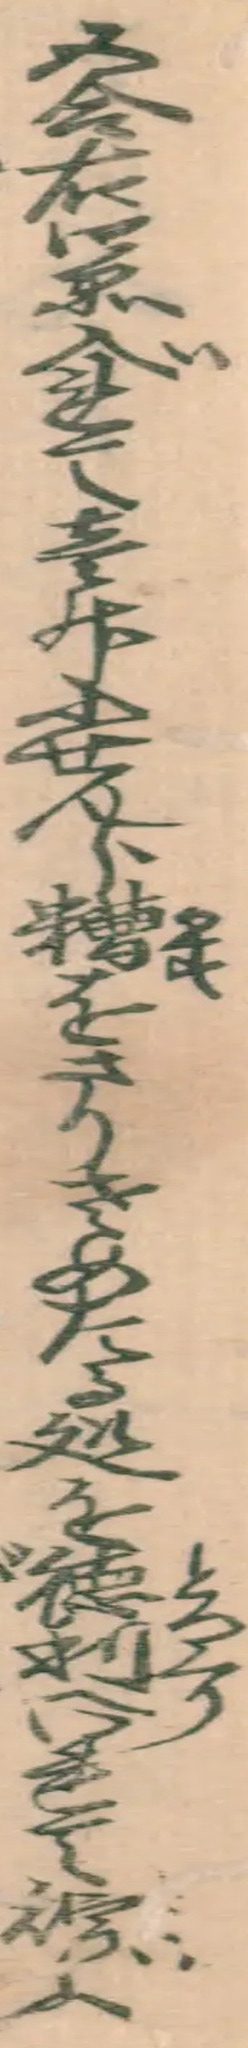五合右四品入れて壱升にせんじ糟をさりさめたる処を徳利へいれて貯ふ
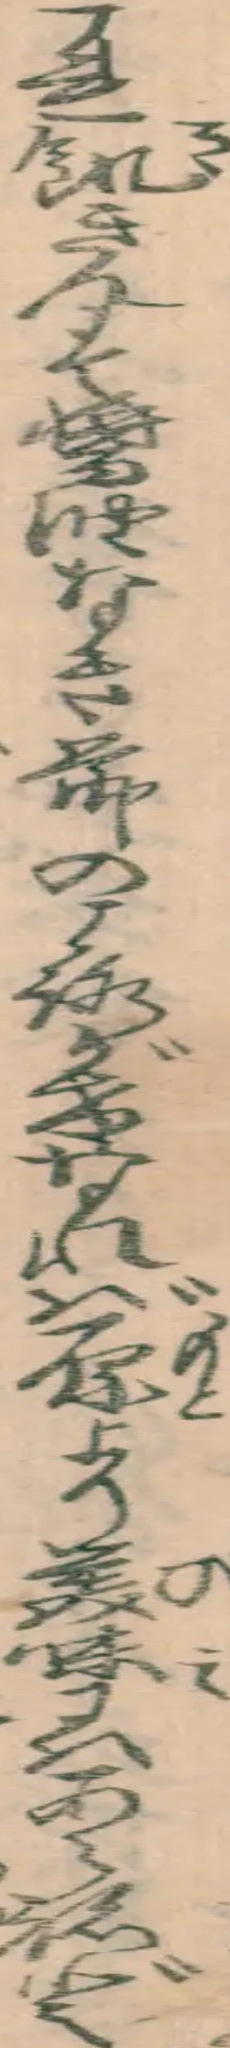これ飢きんにて醤油なき節のこゝろがけなれば原より美味にはあらねど
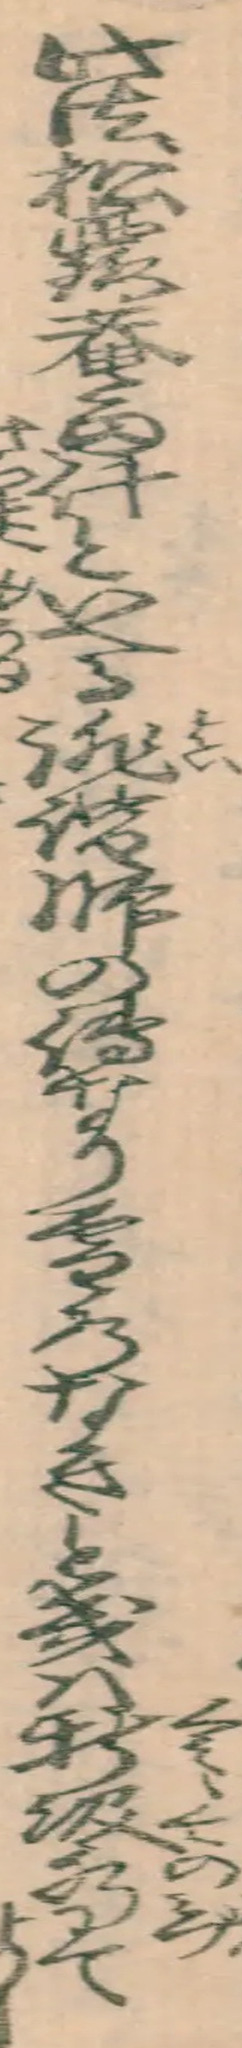此法松露菴雨汁といへる誹諧師の伝なり雪のなきときは新汲水にてよし
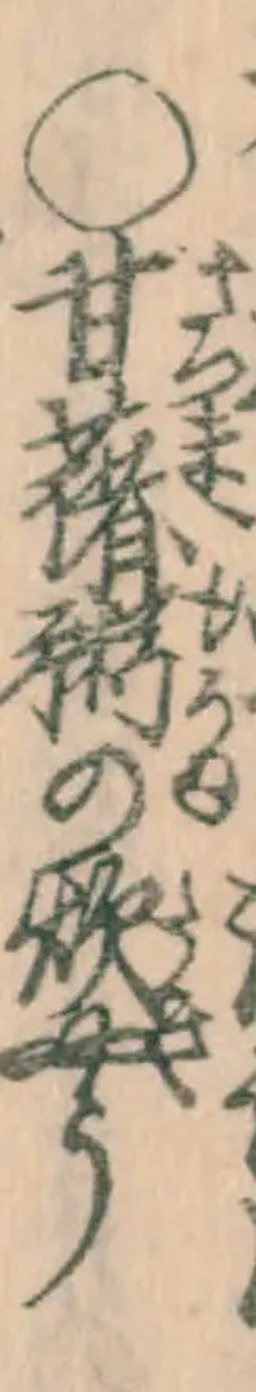○甘藷粥の炊やう
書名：日ごとの心得
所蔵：国立国会図書館 National Diet Library, JAPAN
